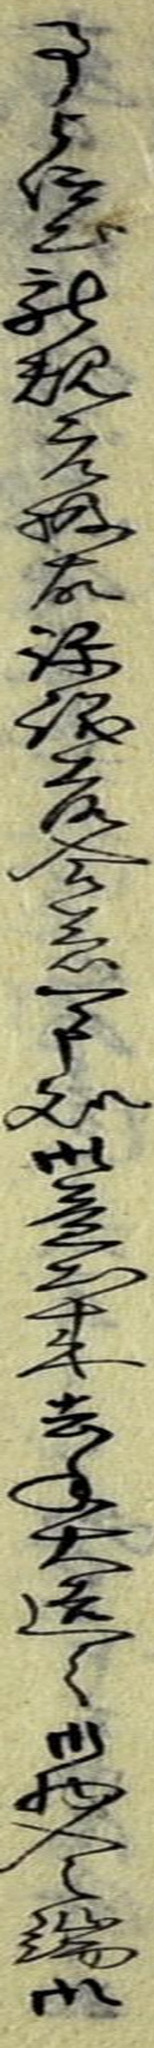事被仰出新規取扱故評儀落合兼可申処御益出来去年大造之御物入之端御
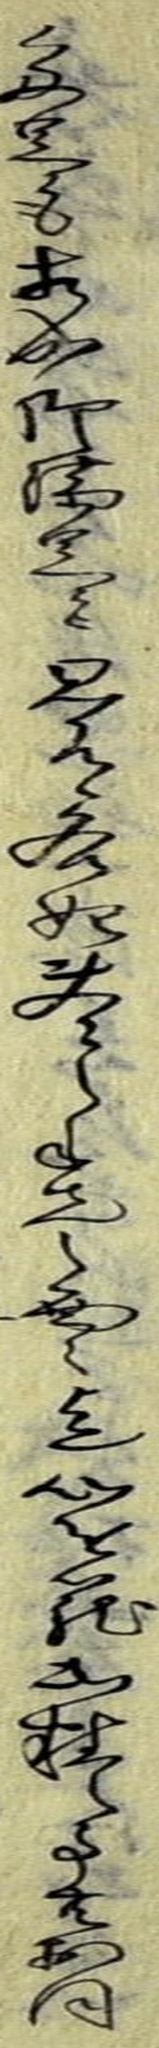多足にも相成御満足に被思召候各始夫々之手先之面々迄心を籠出精候事共於同
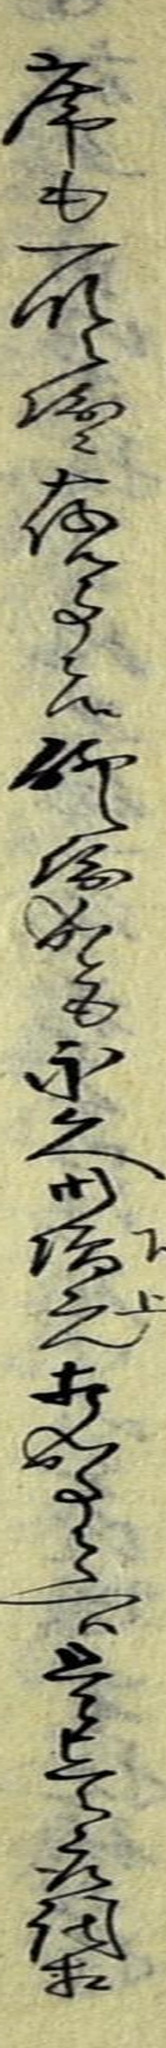席も一段之儀に存候事に候聊之儀成とも永久御元増相成事に候へは是迄取調相
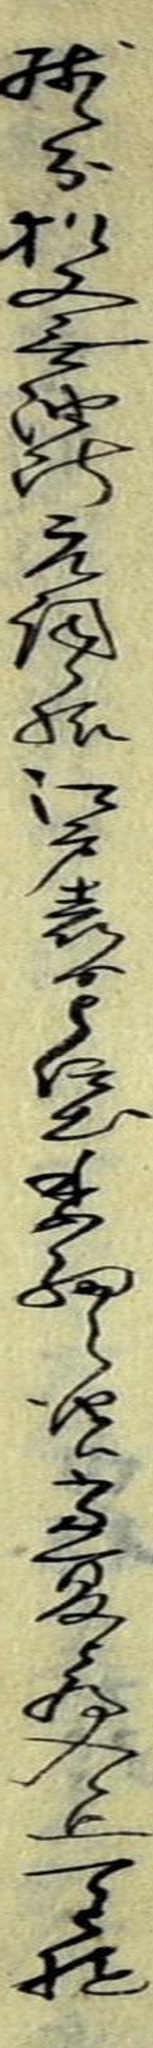残候分猶又無油断取調候様江戸表ゟ被仰出委細之儀ハ当夏被為入候上可被遊
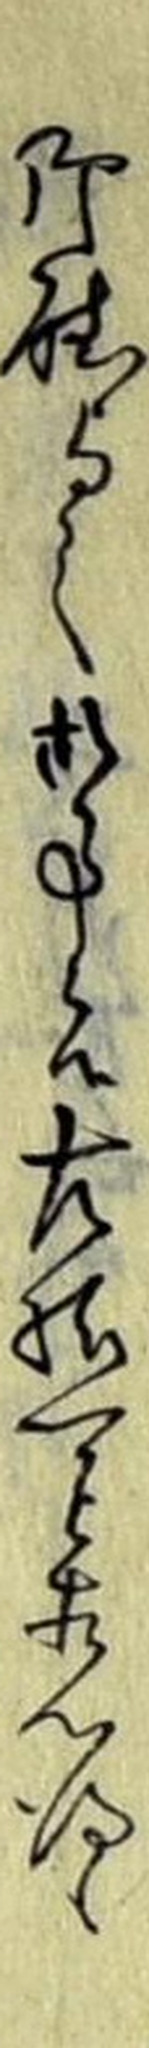御聴と之御事に候左様可被相心得候
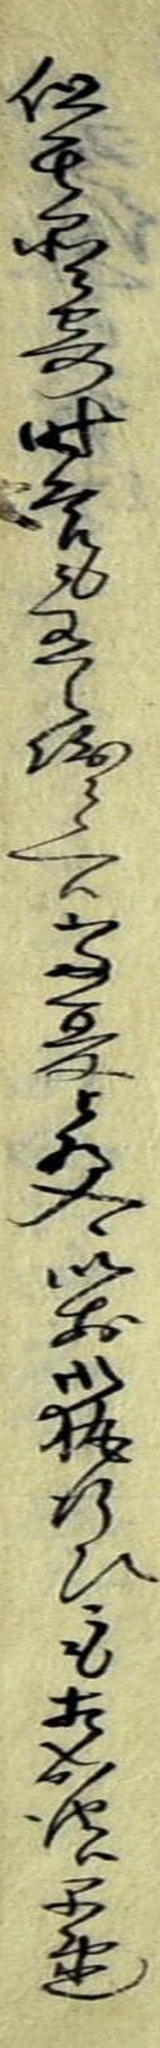但其品に寄時節も有之儀に候へは当夏被為入候以前御執行ひにも相成儀は早速

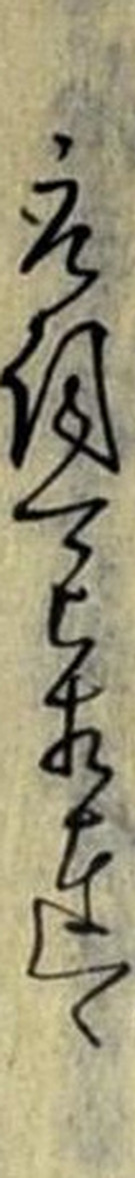取調可被相達候
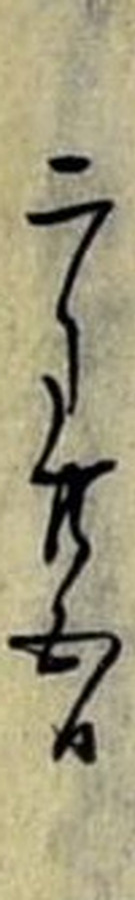二月廿五日
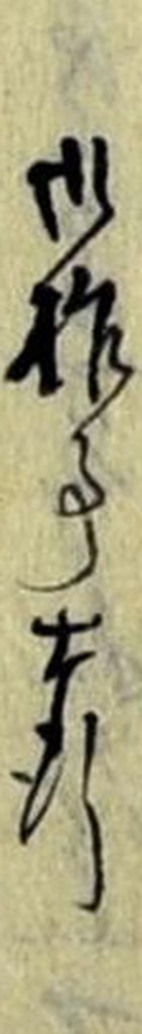御作事奉行
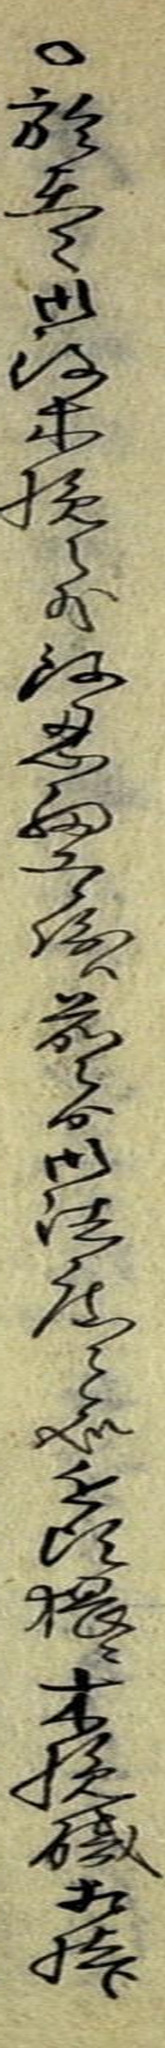○於在々御役木挽之外致忍細工之儀は前々ゟ御法度之処近頃猥に木挽職相挊
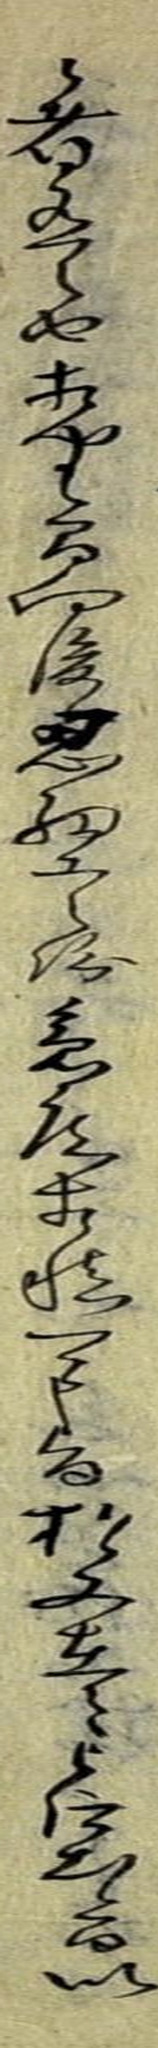候者有之由相聞候間向後忍細工之儀急度相慎可申旨猶又在々被仰出候間以
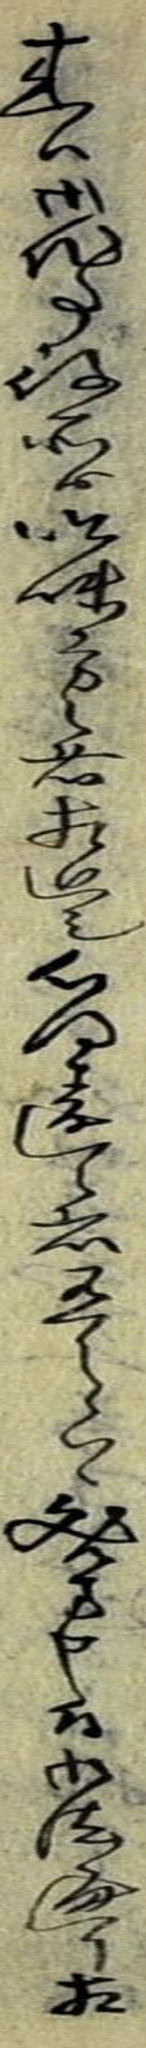来は御作事役所ゟ吟味方之者相廻し心得違之者有之候はヽ咎方申付御法通相
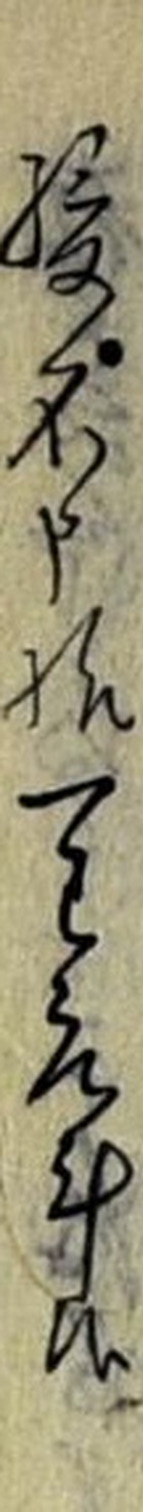緩不申候様可被取斗候
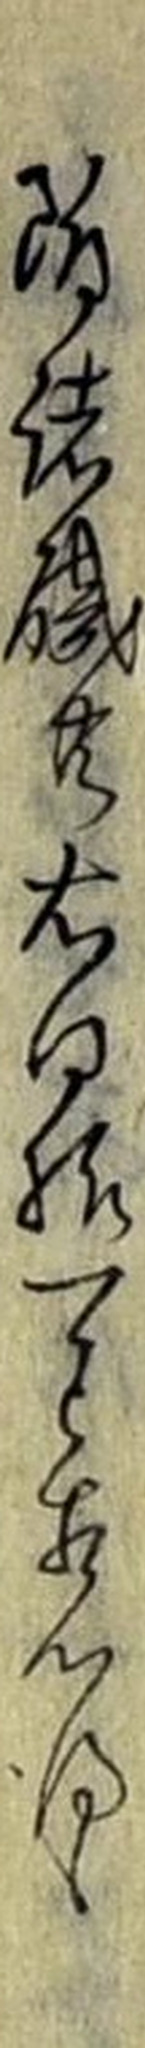附諸職共右同様可被相心得候
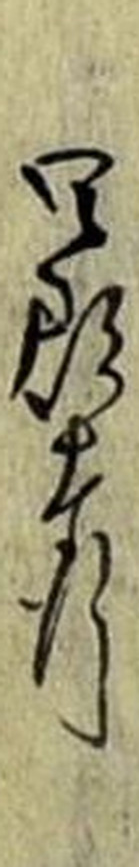四郡奉行
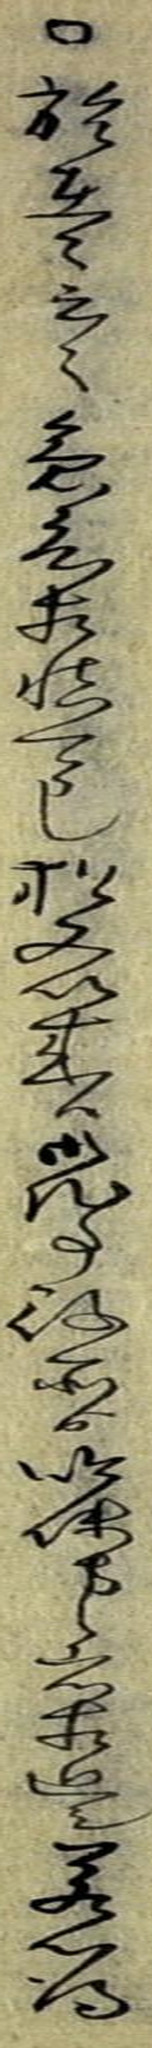○於在々云々急度相慎可申候猶又以来は御作事役所ゟ吟味方之者相廻し若心得
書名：命令之部 四
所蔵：福井県文書館 Fukui Prefectural Archives
